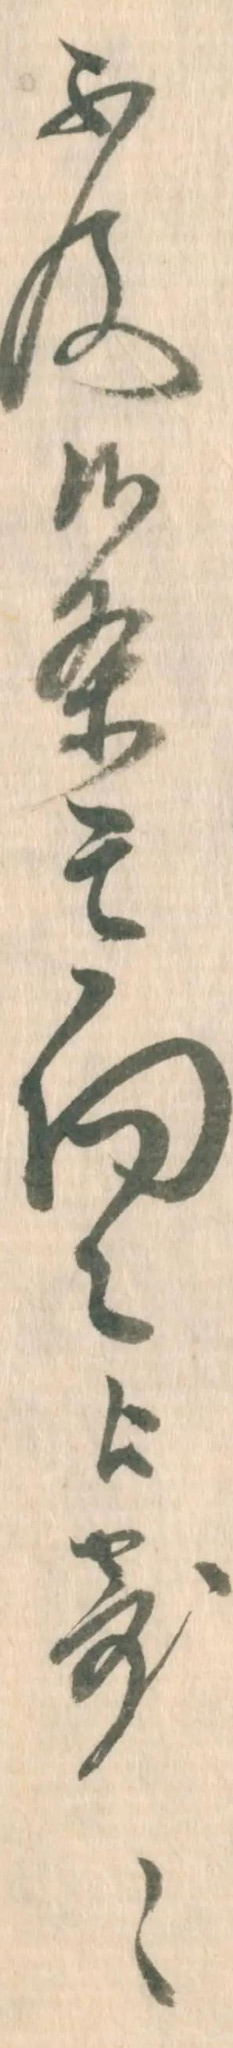不及候条其向〻え寄〻
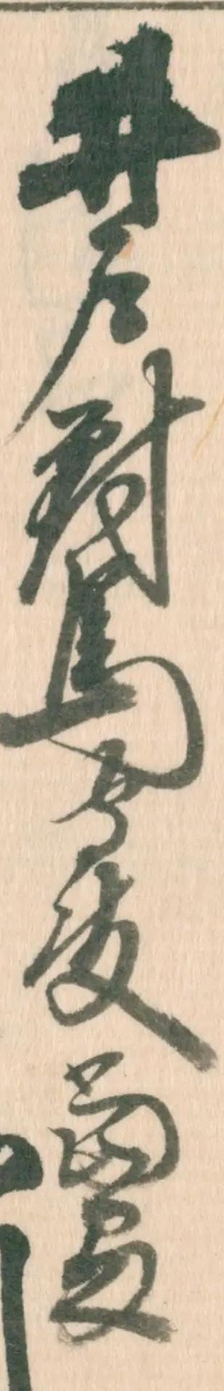│井戸対馬守殿当番
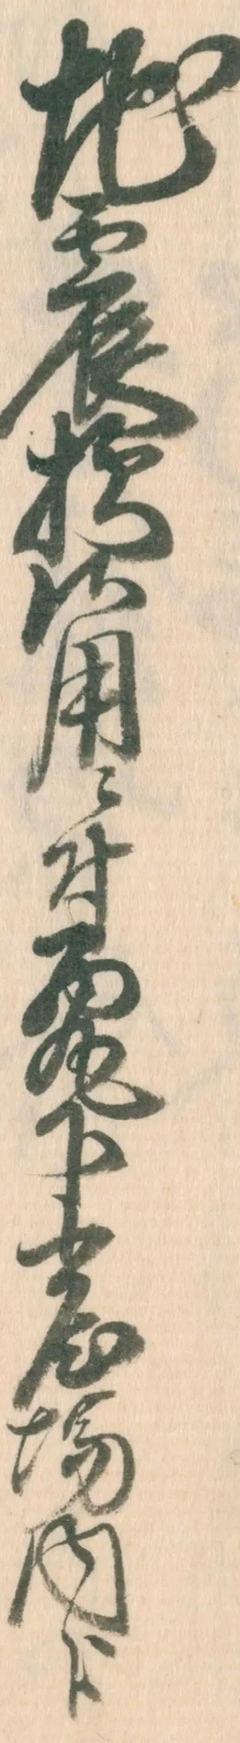地震損御用ニ付西丸下小屋場内え
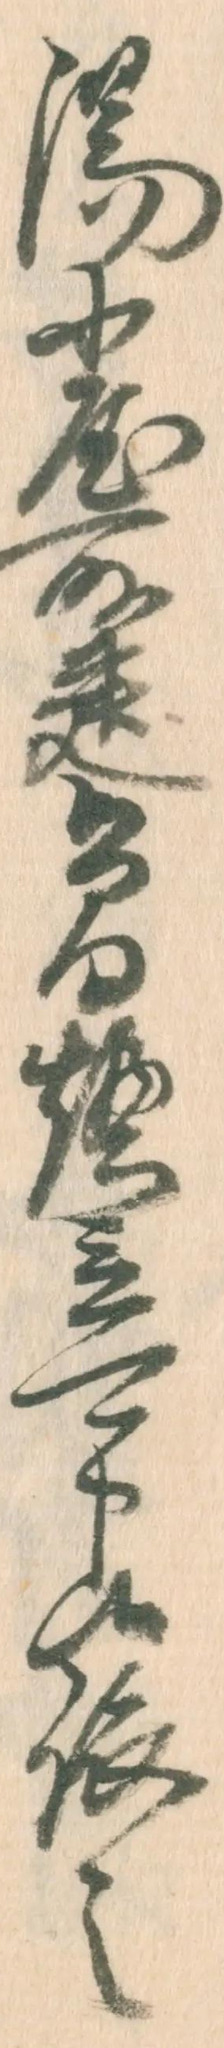湯小屋取建候間煙立可申候依之
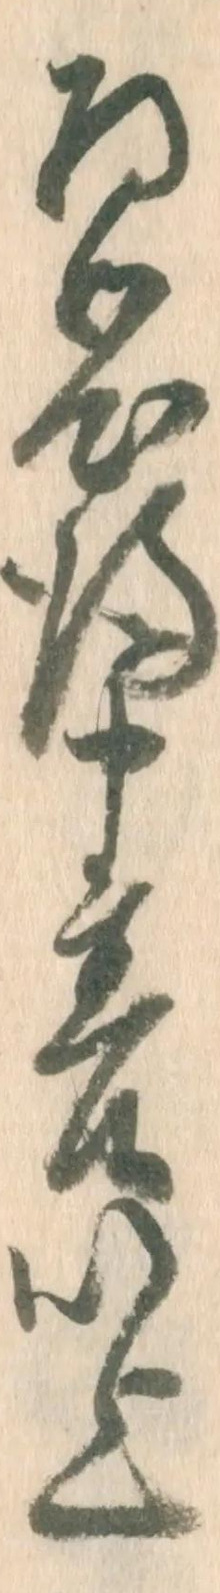為御心得申置候以上

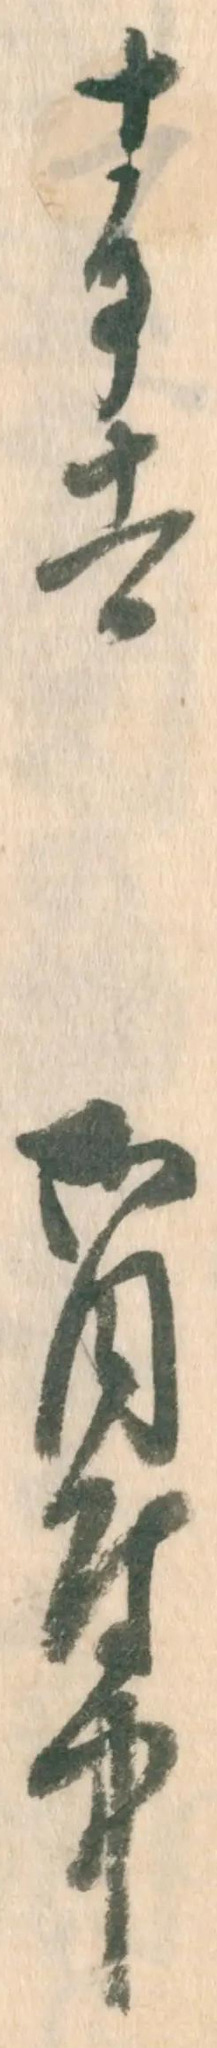十月十一日御目付中
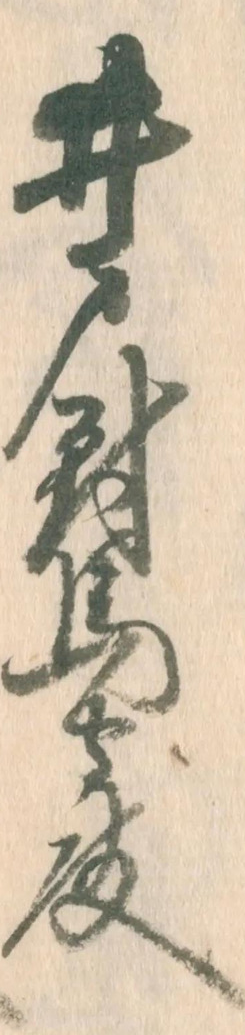井戸対馬守殿
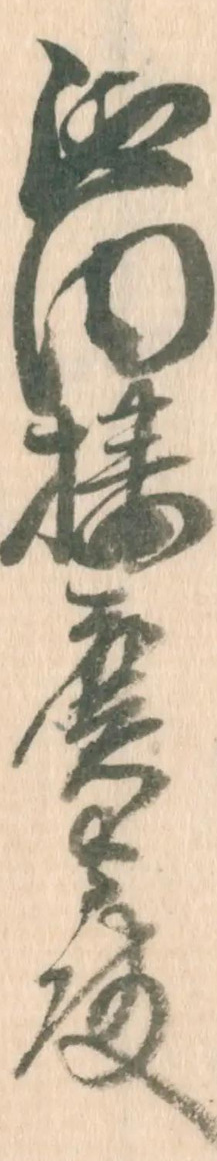池田播磨守殿
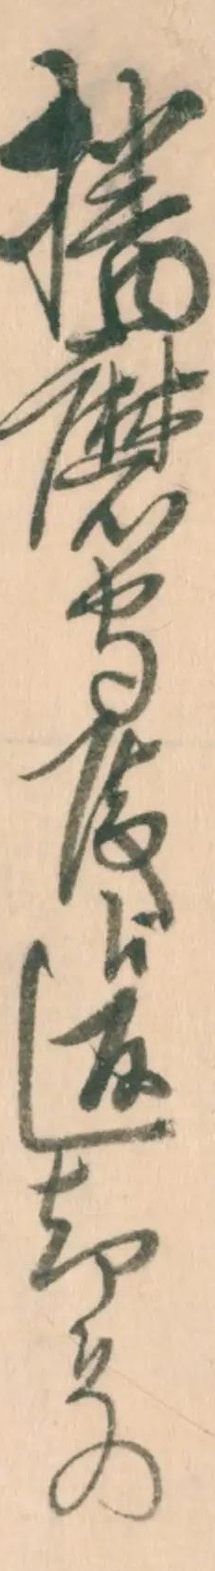「播磨守殿え返却もの」
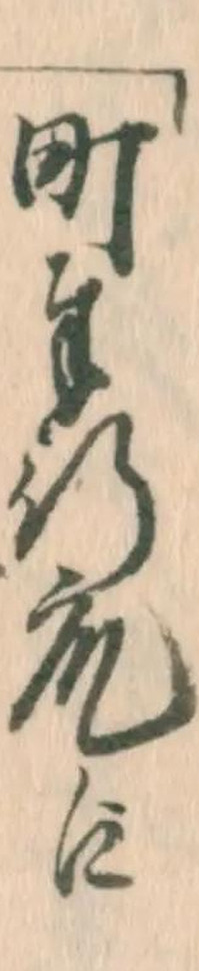││町奉行衆え
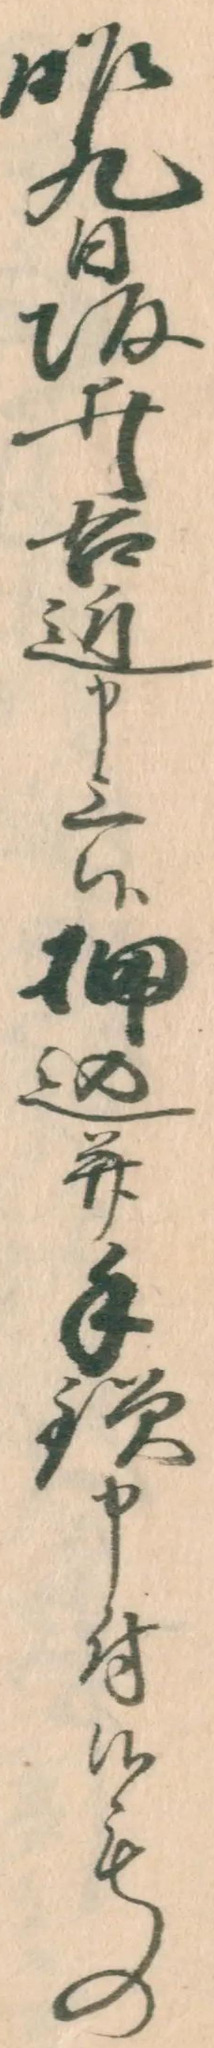昨九日坂井右近申上候押込幷手鎖申付候もの
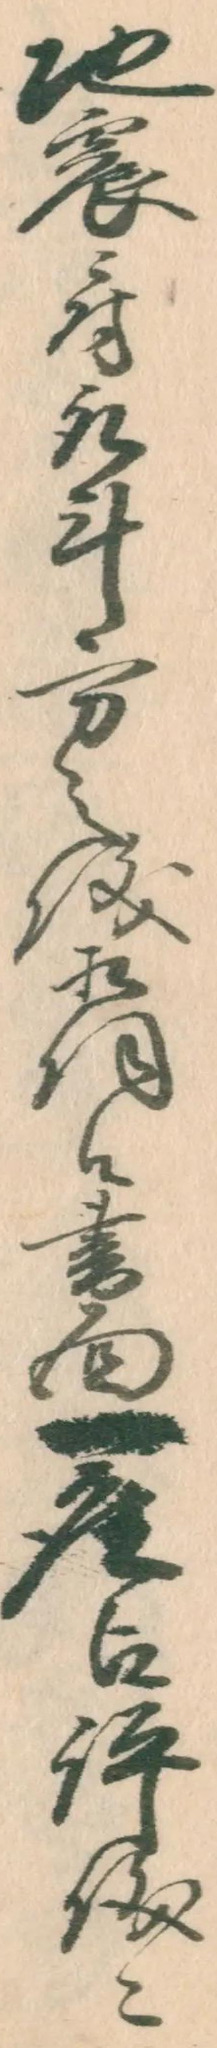地震ニ付取計方之儀相伺候書面一座え評議ニ
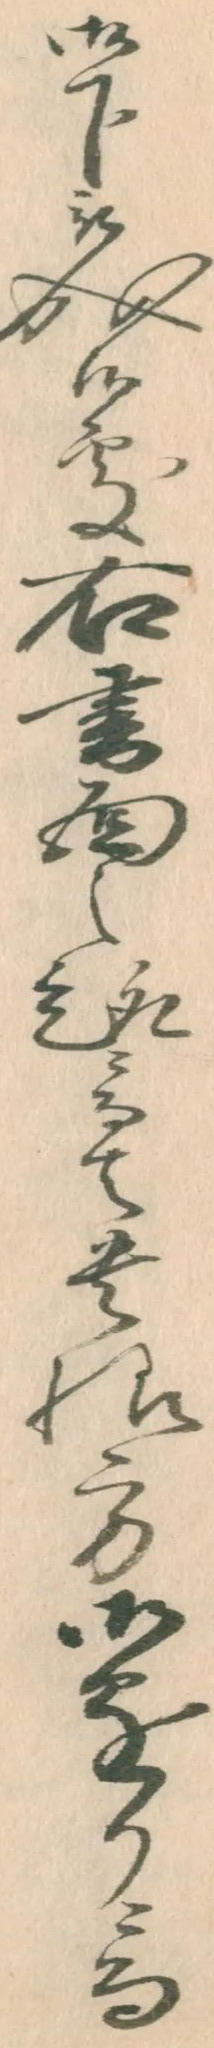御下被成候処右書面之趣ニては貴様方御懸りニて

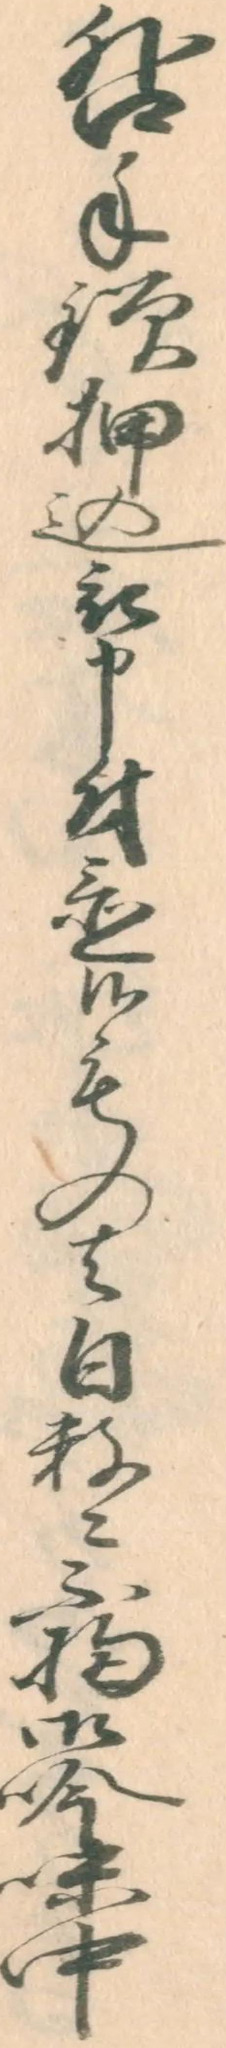咎手鎖押込被申付置候ものは日数ニ不拘御吟味中
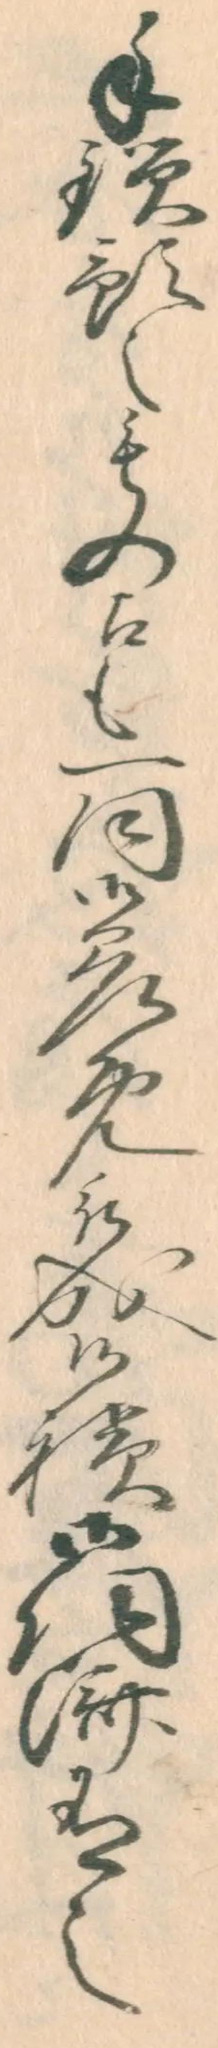手鎖預之ものえも一同御差免被成御積御伺済有之
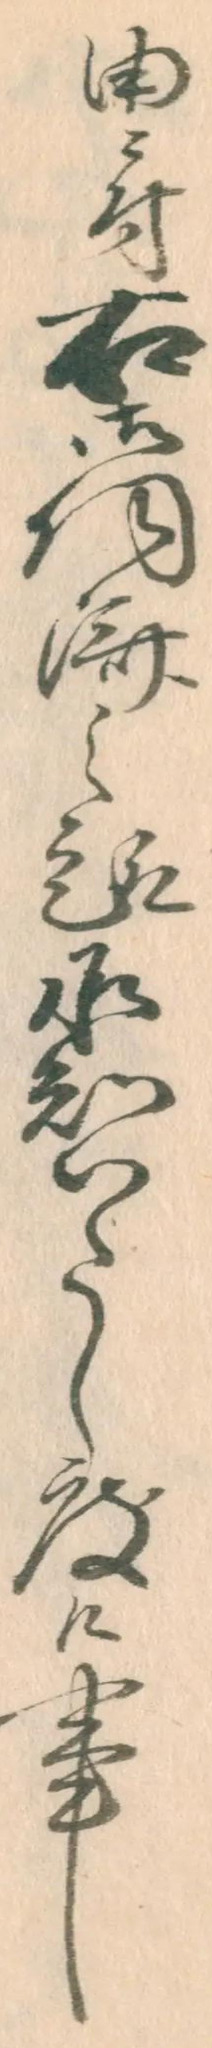由ニ付右御伺済之趣承知いたし度候事
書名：地震災書留 2巻. [2] 内表紙に「地震一件　安政二卯年十月」とあり
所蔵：国立国会図書館 National Diet Library, JAPAN
